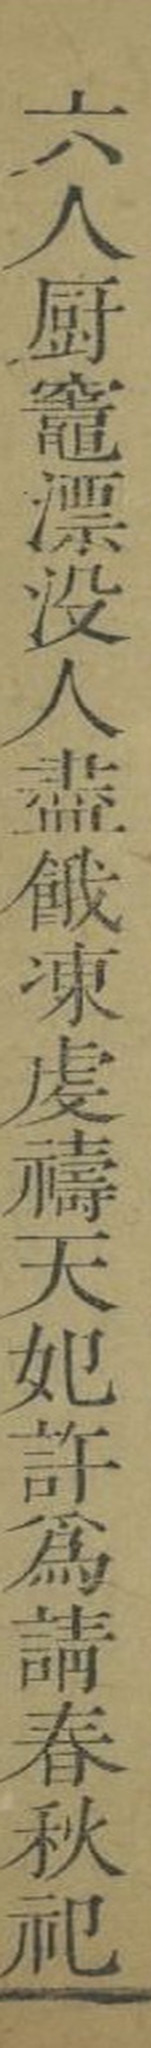六人厨竈漂没人盡餓凍䖍禱天妃許爲請春秋祀
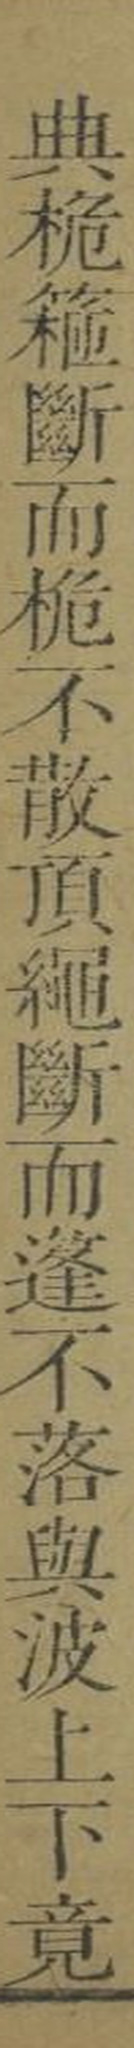典桅篐斷而桅不散頂繩斷而篷不落與波上下竟

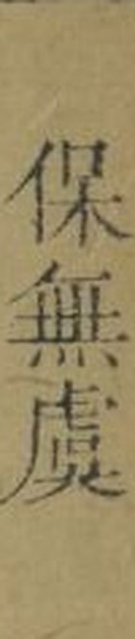保無虞
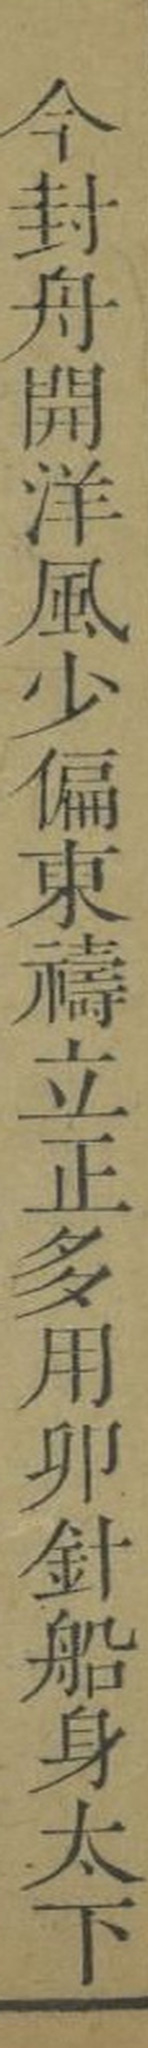今封舟開洋風少偏東禱立正多用卯針船身太下
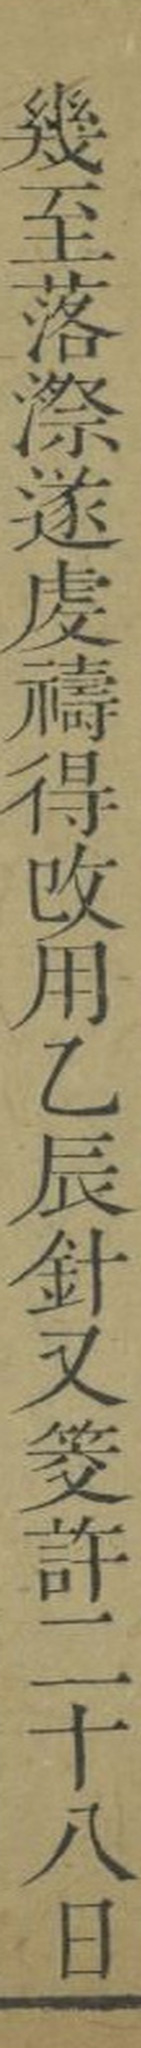幾至落漈遂䖍禱得攺用乙辰針又筊許二十八日
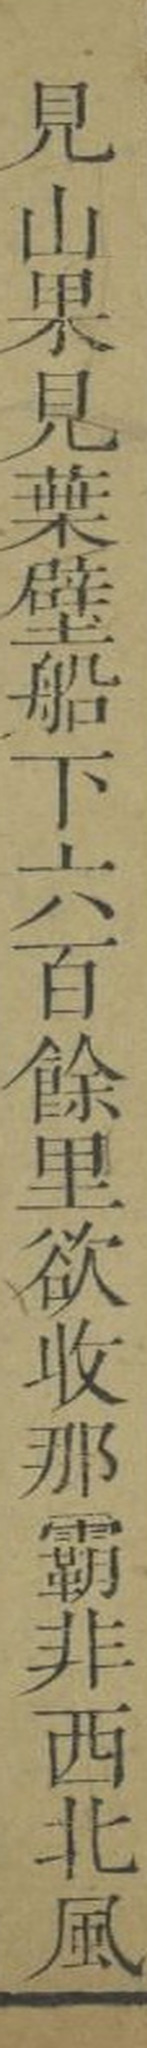見山果見葉壁船下六百餘里欲收那霸非西北風
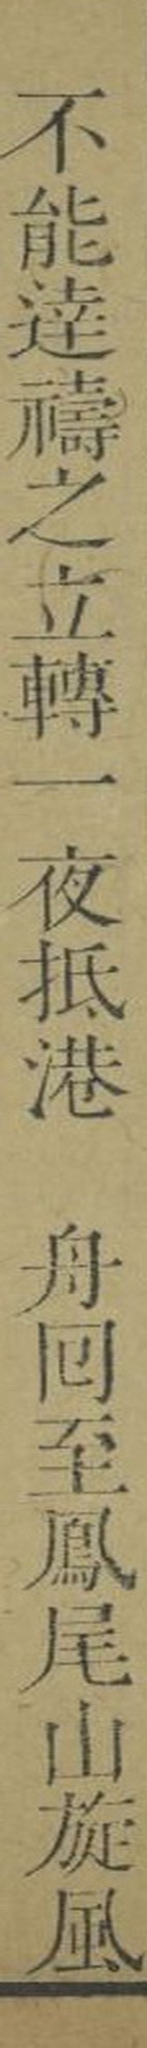不能逹禱之立轉一夜抵港舟囘至鳳尾山旋風
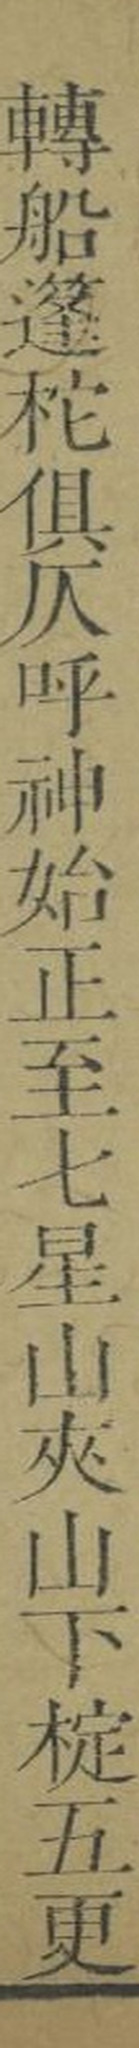轉船篷柁俱仄呼神始正至七星山夾山下椗五更
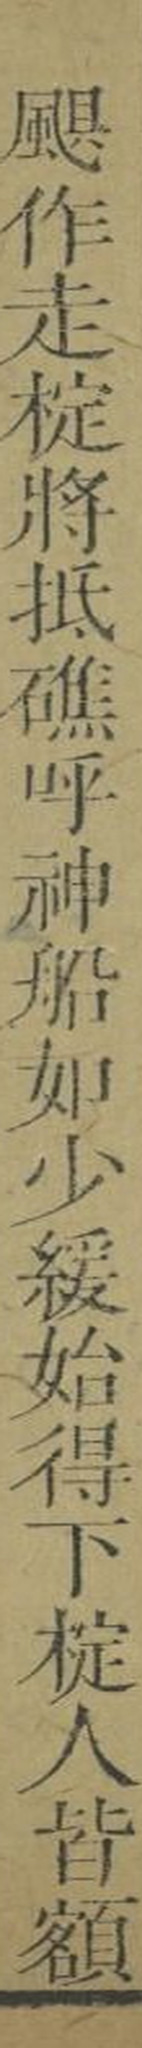颶作走椗將抵礁呼神船如少緩始得下椗人皆額
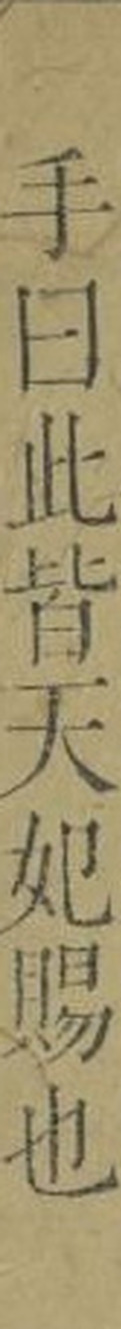手曰此皆天妃賜也
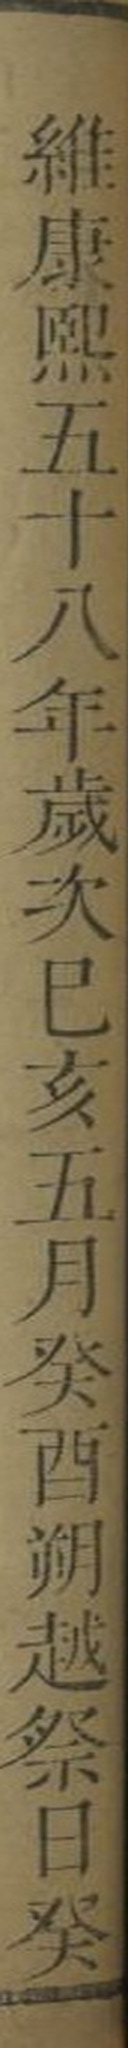維康熙五十八年歲次巳亥五月癸酉朔越祭日癸
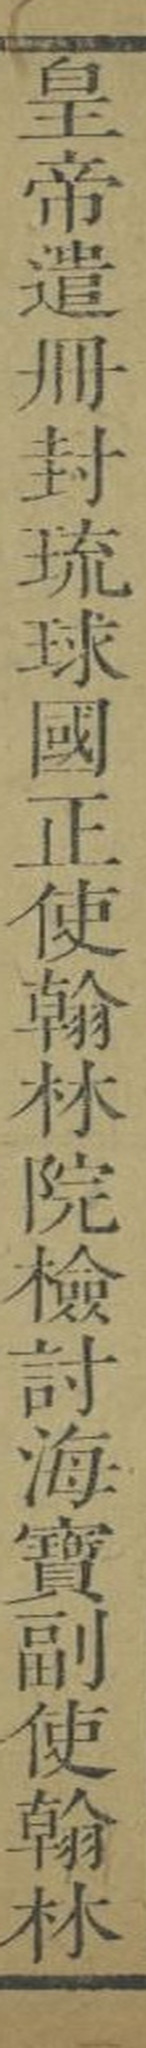皇帝遣冊封琉球國正使翰林院檢討海寶副使翰林
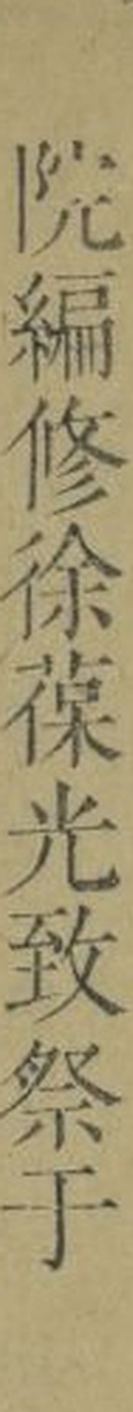院編修徐葆光致祭于
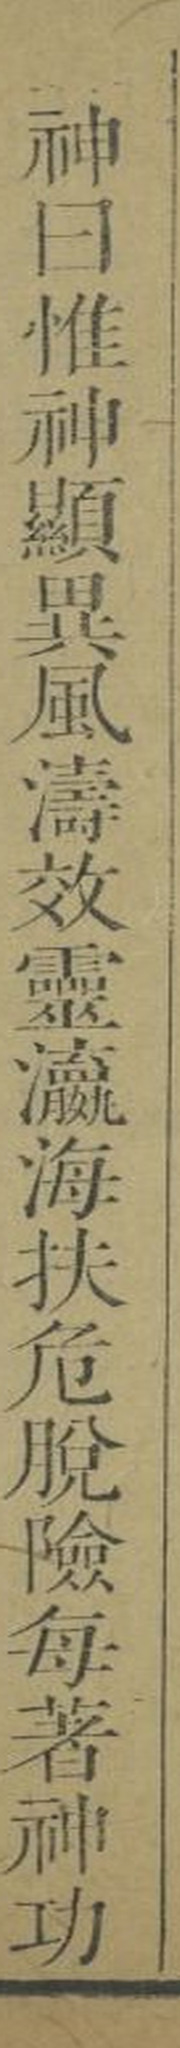神曰惟神顯異風濤效靈瀛海扶危脫險每著神功
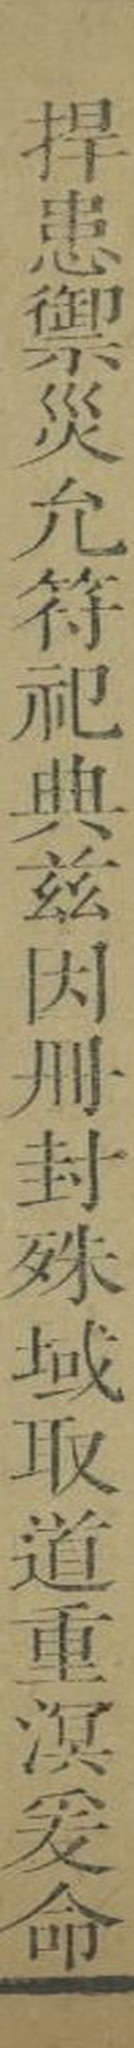捍患禦災允符祀典茲因冊封殊域取道重溟爰命
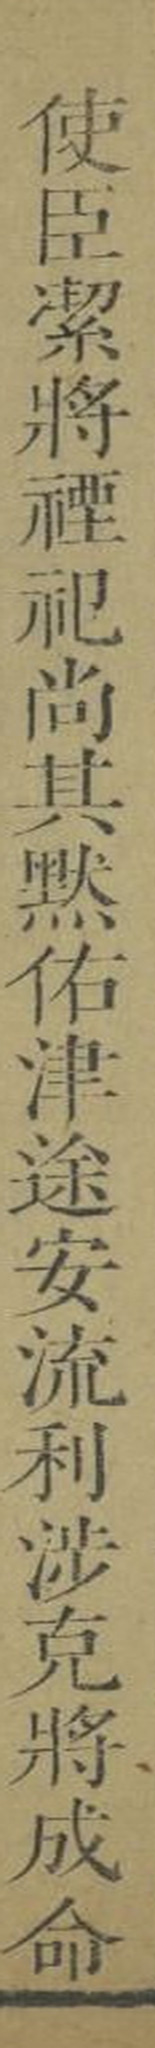使臣㓗將禋祀尚其默佑津途安流利涉克將成命
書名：中山伝信録 巻一
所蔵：University of the Ryukyus Library
